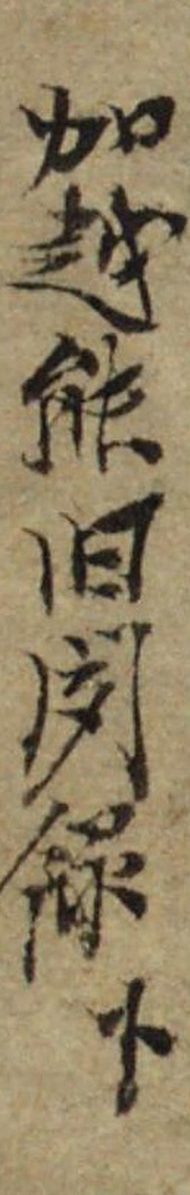加越能旧聞録下

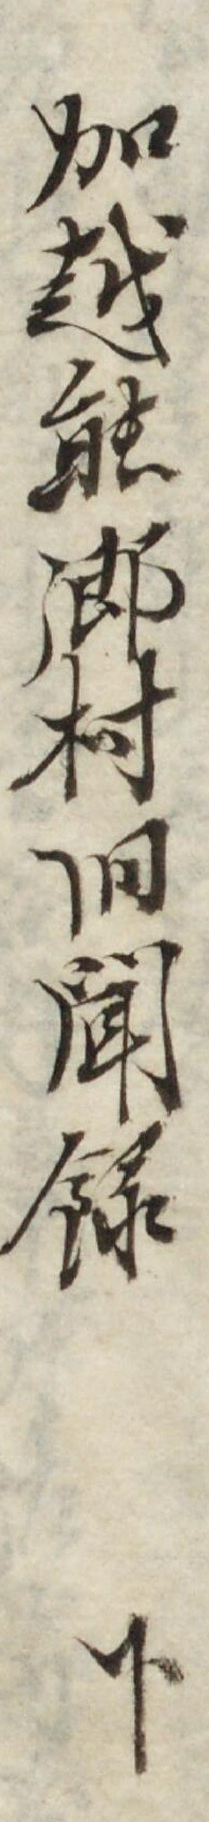加越能郷村旧聞録下

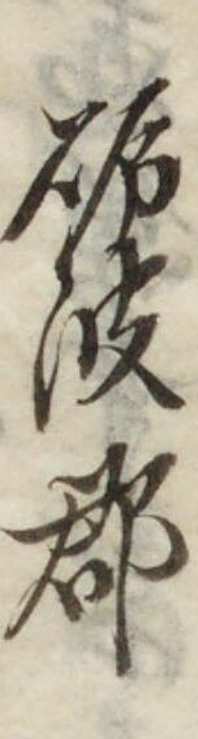砺波郡
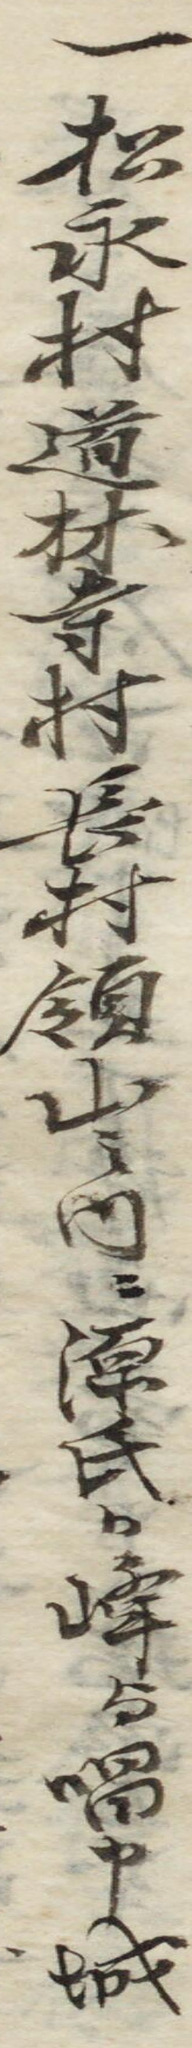一松永村道林寺村長村領山之内に源氏か峰と唱申城
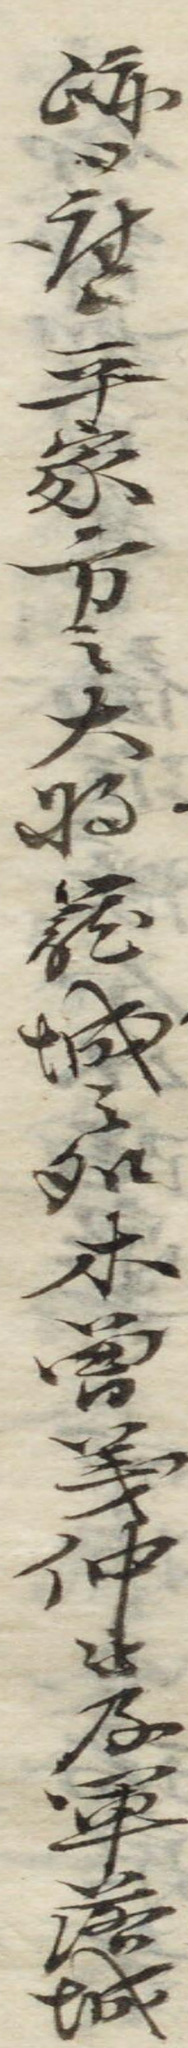跡御座候平家方之大将籠城之処木曽義仲被及軍落城
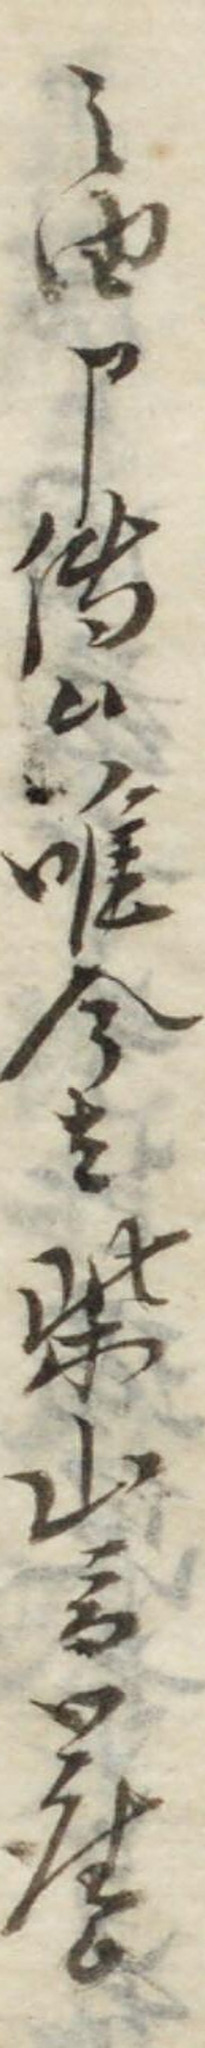之由申伝候唯今は柴山にて御座候
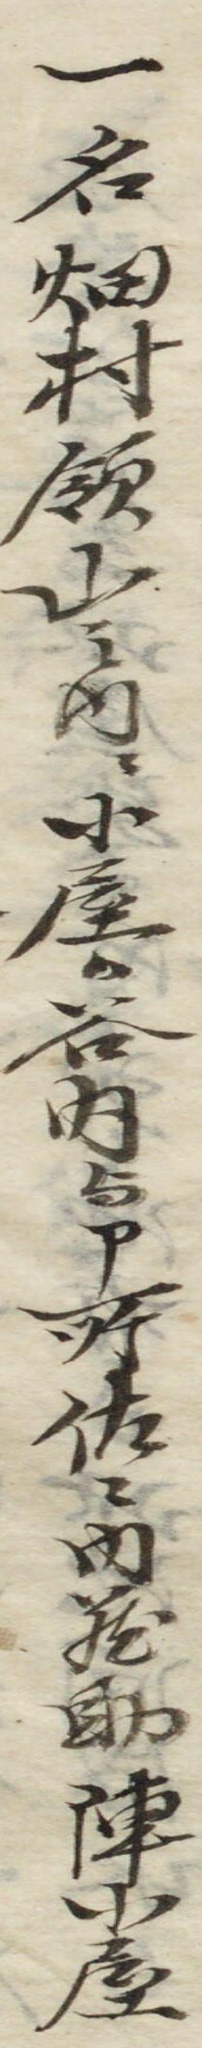一名畑村領山之内に小屋か谷内と申所佐々内蔵助陣小屋
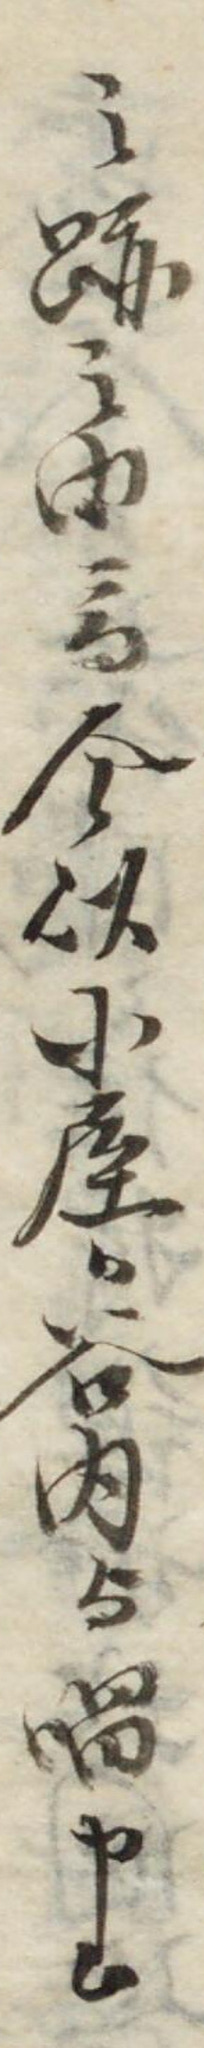之跡之由にて今以小屋か谷内と唱申候
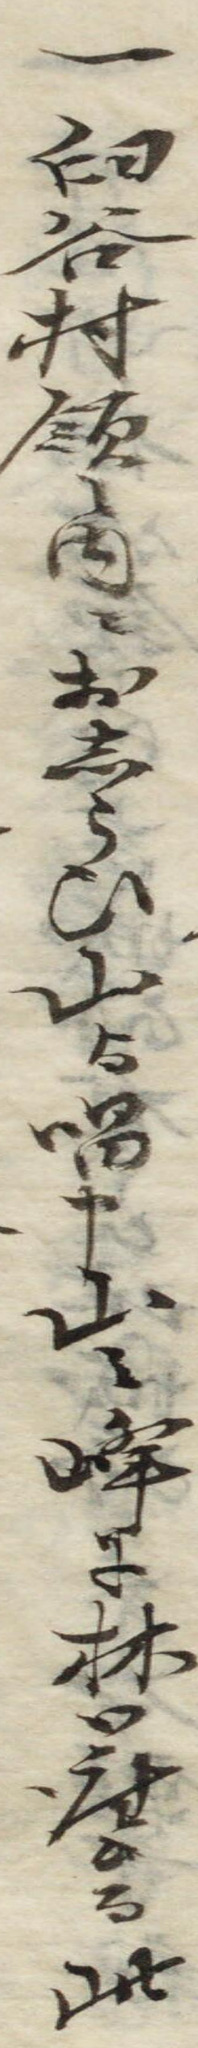一臼谷村領之内におしらひ山と唱申山之峰に林御座候て此
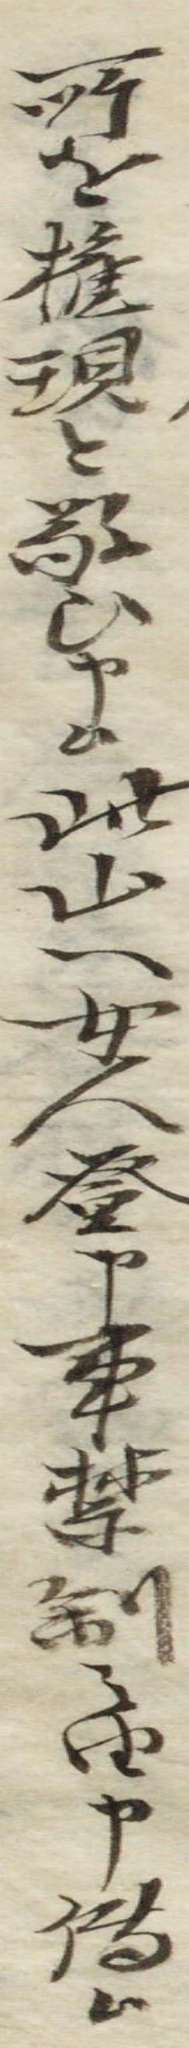所を権現と敬ひ申候此山へ女人登申事禁制之由申伝候
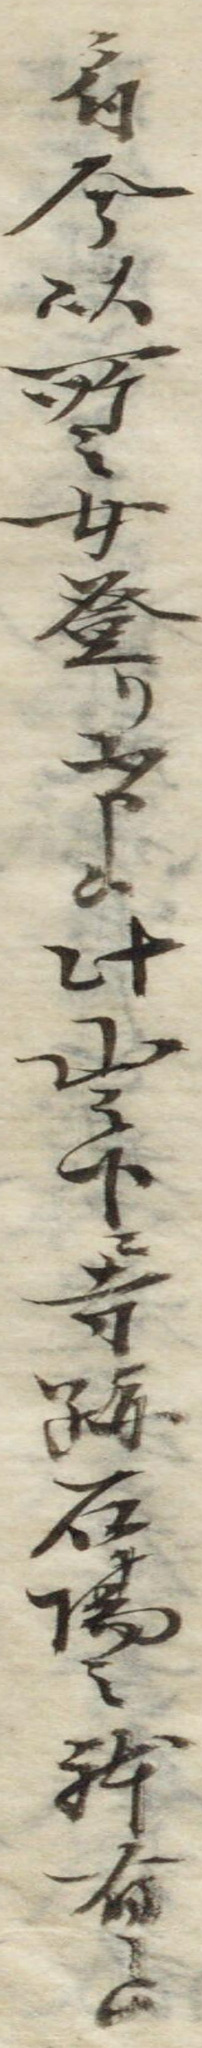に付今以所之女登り不申候此山之下に寺跡石場之体有之候
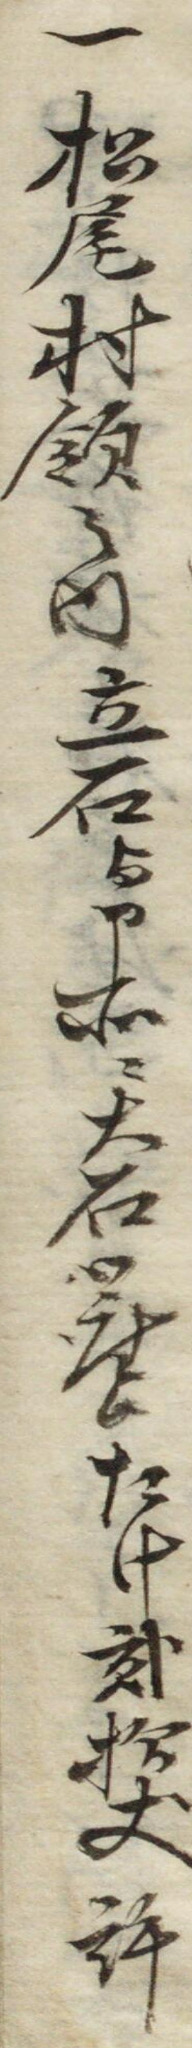一松尾村領之内立石と申所に大石御座候たけ弐拾丈許

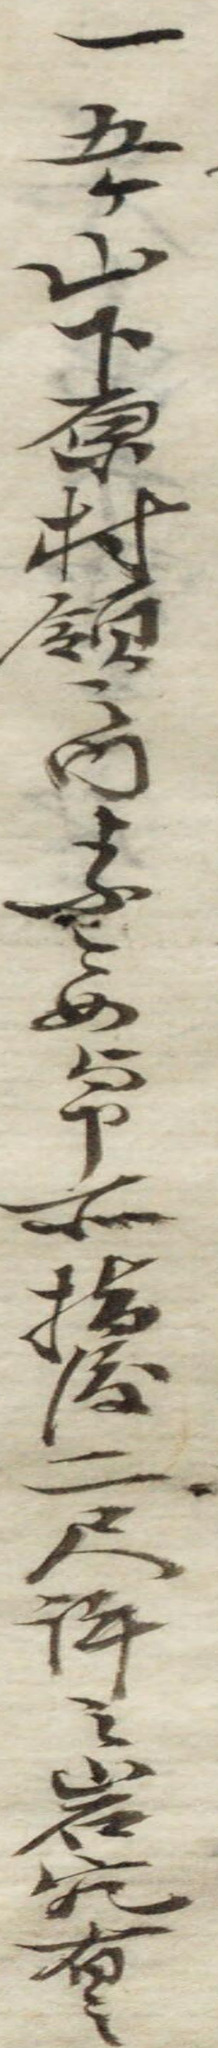一五ヶ山下原村領之内よふとめ与申所指渡二尺許之岩穴有之
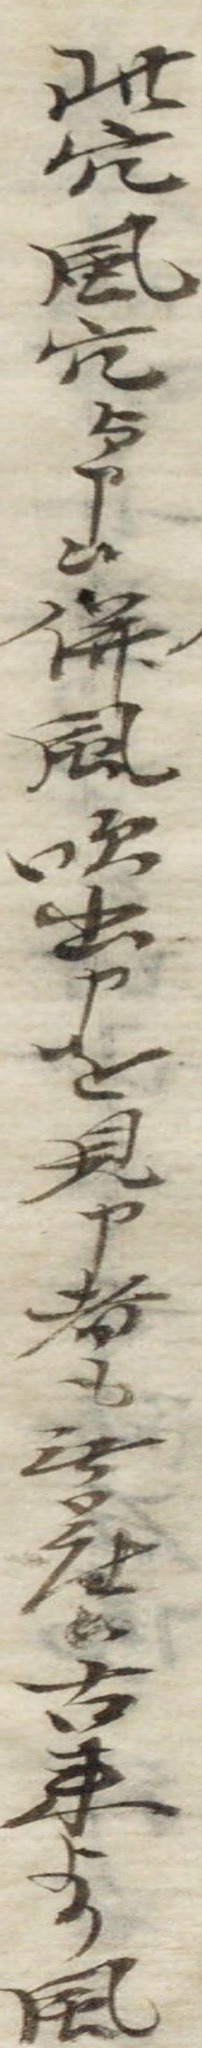此穴風穴与申候併風吹出申を見申者も無御座候古来より風
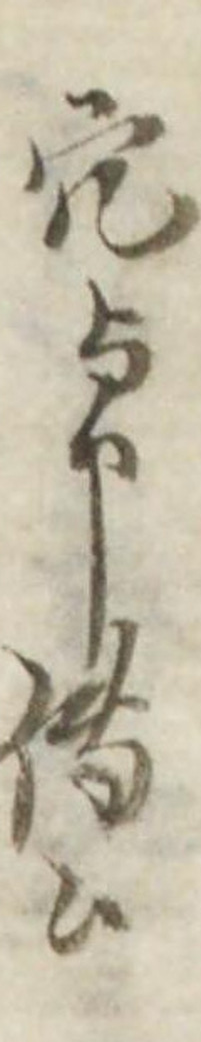穴与申伝候
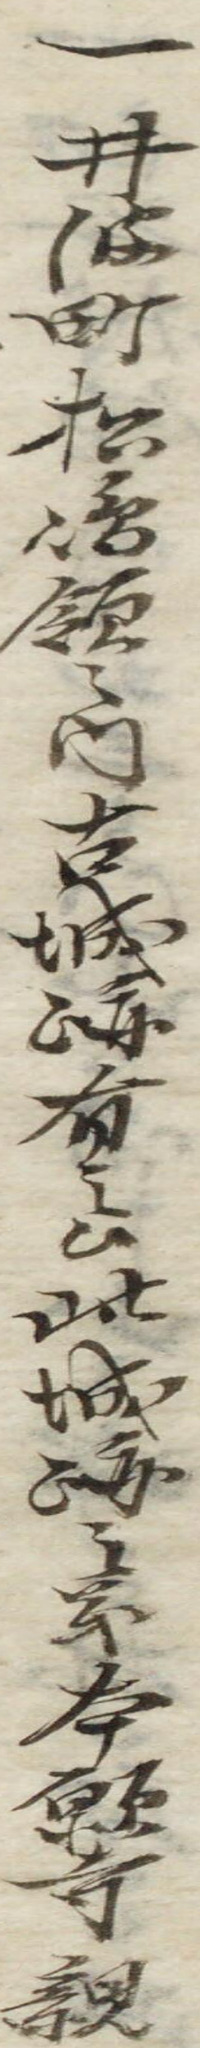一井波町松嶋領之内古城跡有之候此城跡之義本願寺親
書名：加越能旧聞録
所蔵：Ishikawa Prefectural Library
